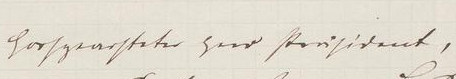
Hochgeachteter Herr Präsident,
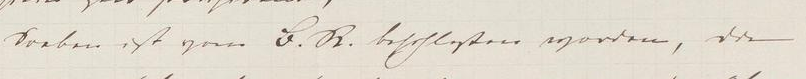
Soeben ist vom B.R. beschloßen worden, die
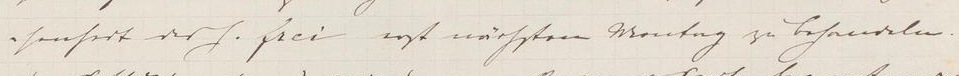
senheit des H. Frei erst nächsten Montag zu behandeln.
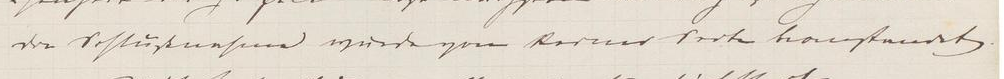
Die Schlußnahme wurde von keiner Seite beanstandet.
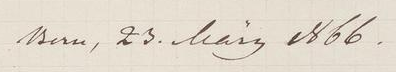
Bern, 23. März 1866.
